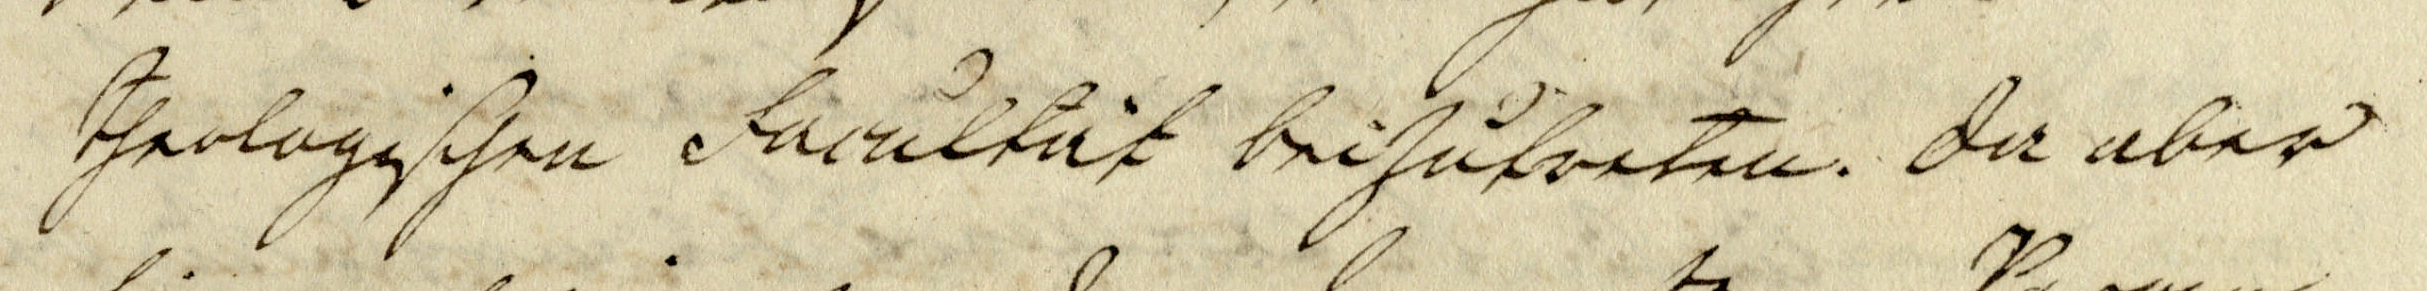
Theologischen Facultät beizutreten. Da aber
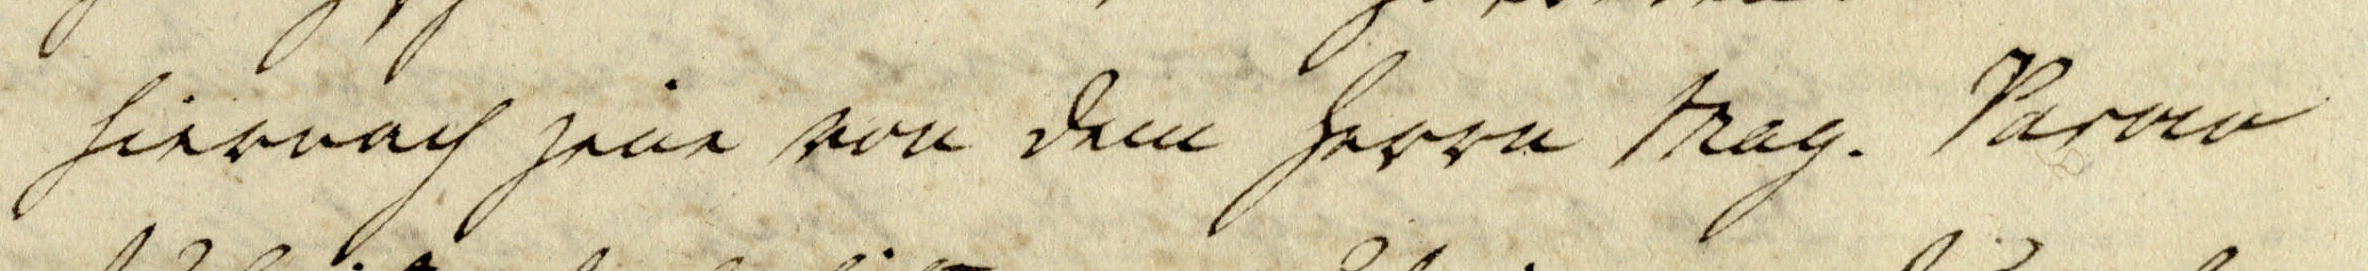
hiernach jene von dem Herrn Mag. Parow
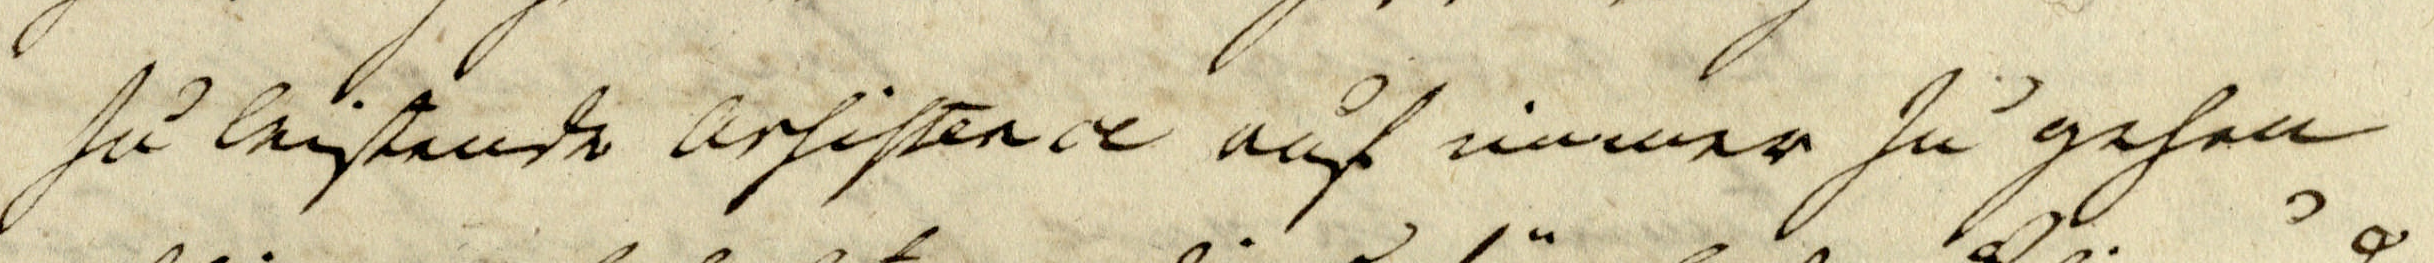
zu leistende Assistence auf immer zu gehen
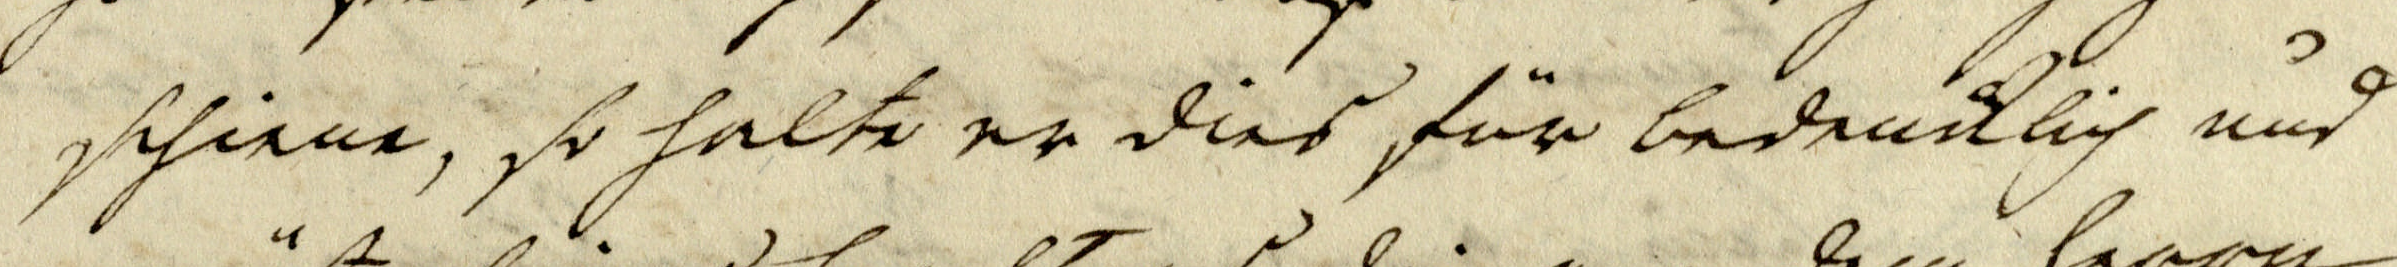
schiene, so halte er dies für bedencklich und
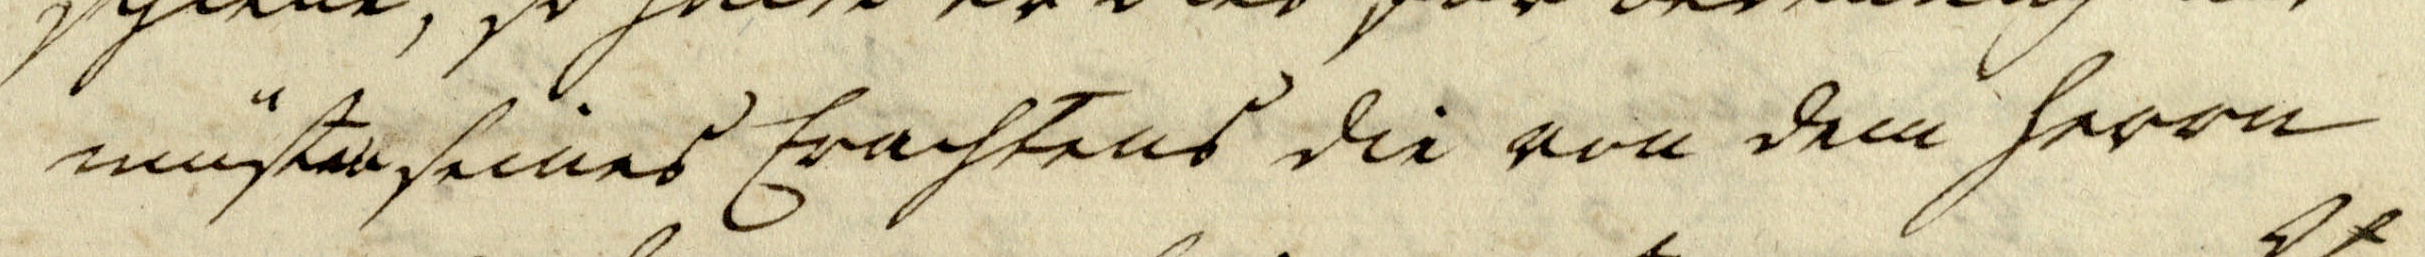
müsten seines Erachtens die von dem Herrn
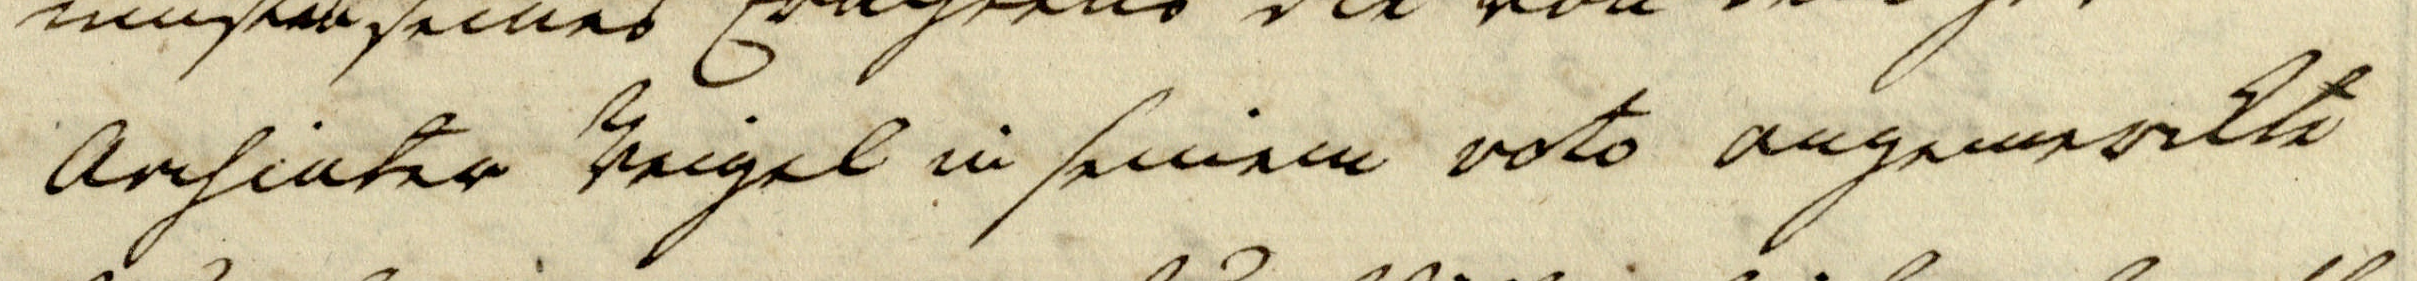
Archiater Weigel in seinem voto angemerckte
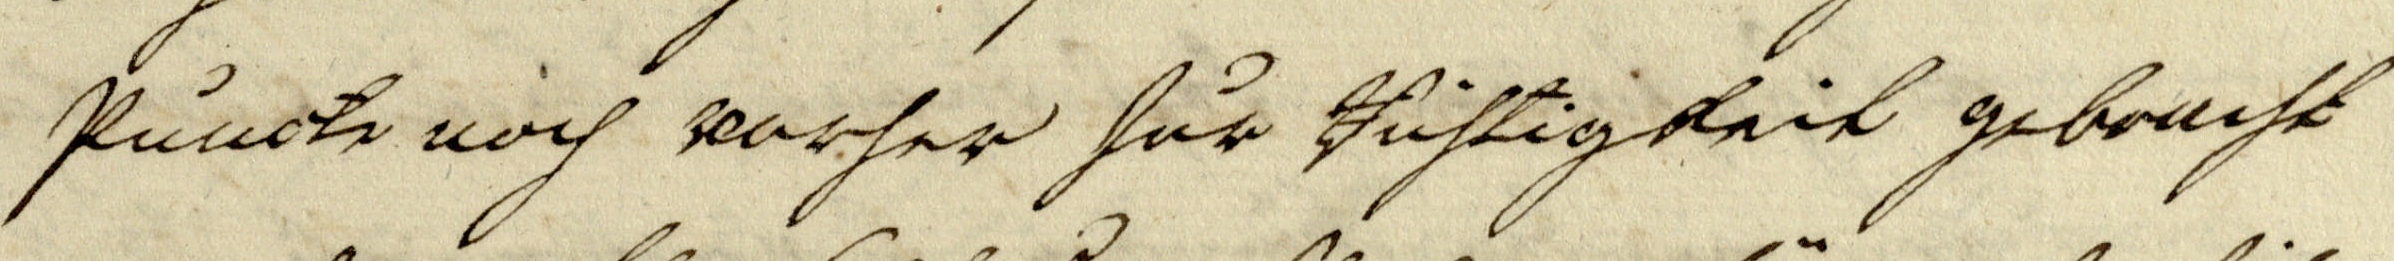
Puncte noch vorher zur Richtigkeit gebracht
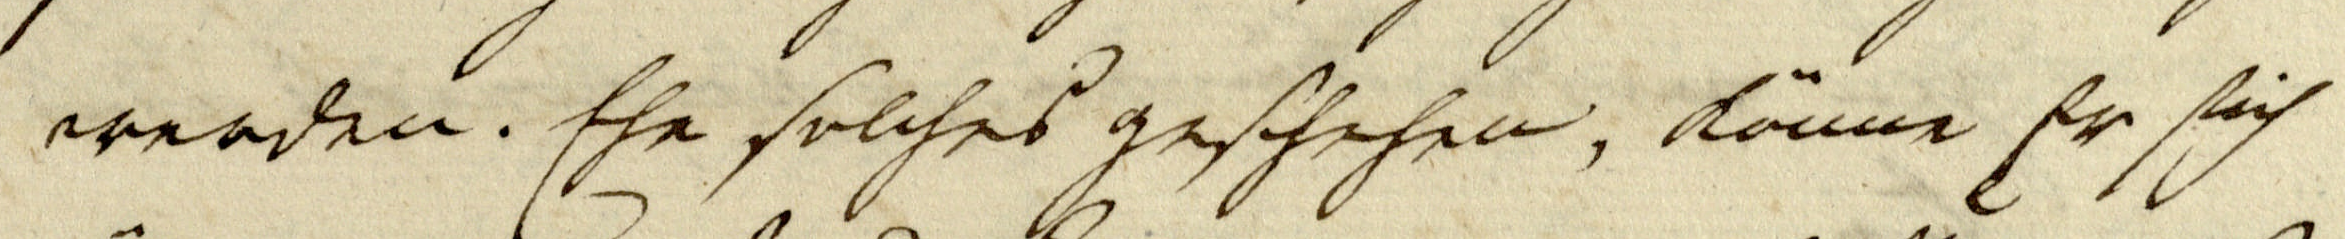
werden. Ehe solches geschehen, könne Er sich
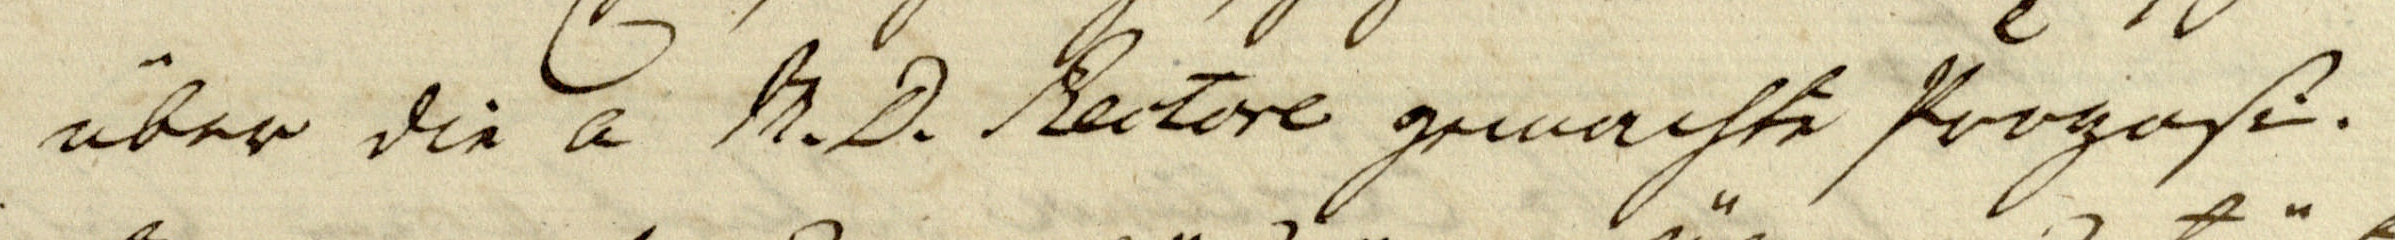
über die a M. D. Rectore gemachte Proposi¬
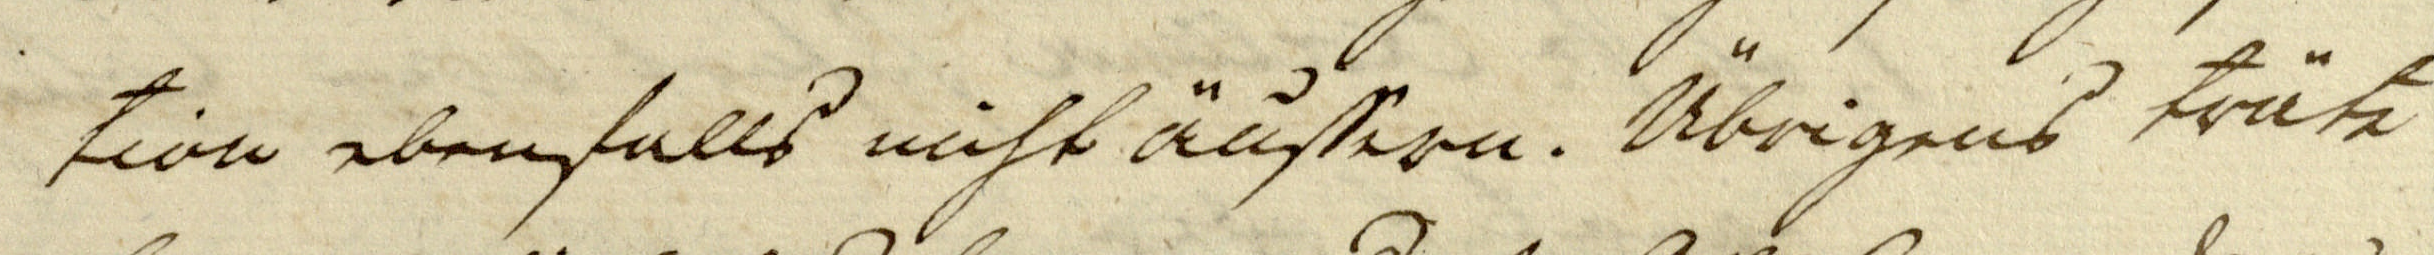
tion ebenfalls nicht äussern. Übrigens träte
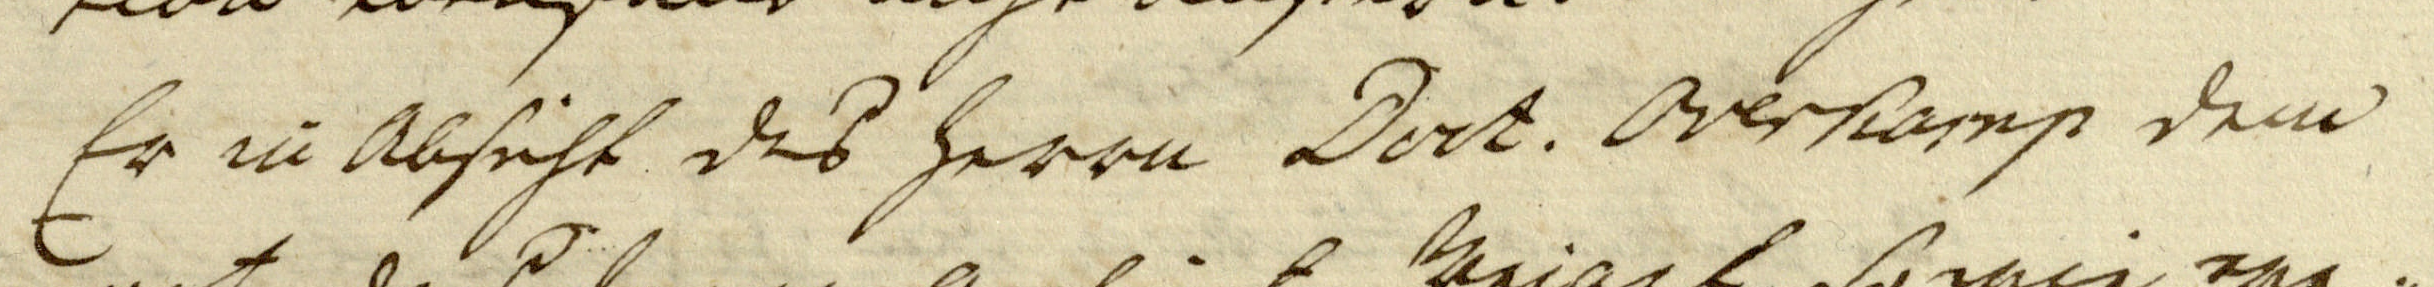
Er in Absicht des Herrn Doct. Overkamp dem
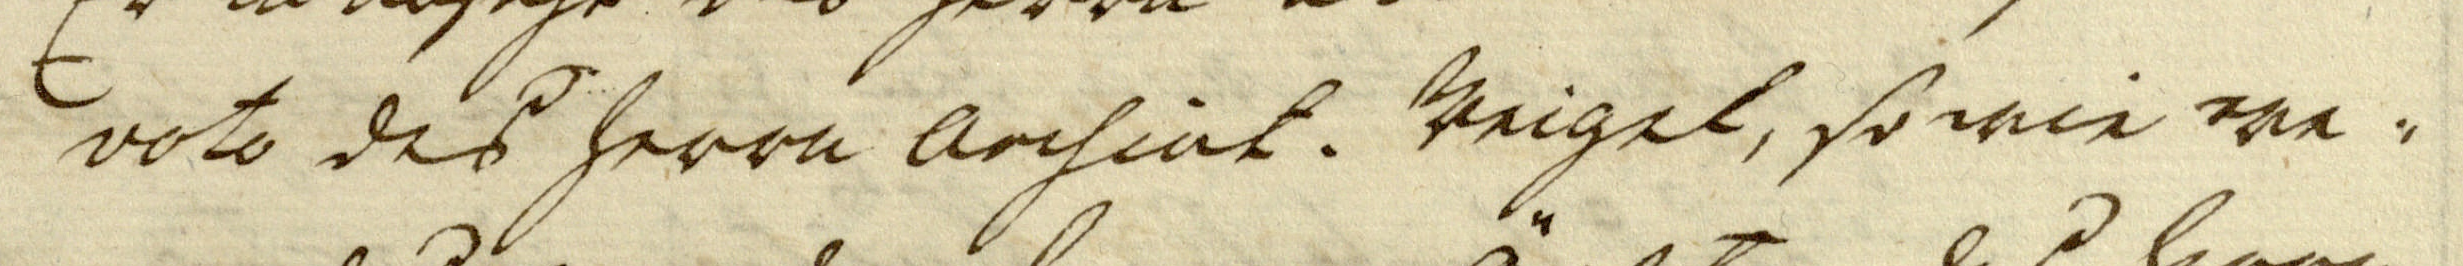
voto des Herrn Archiat. Weigel, so wie we¬
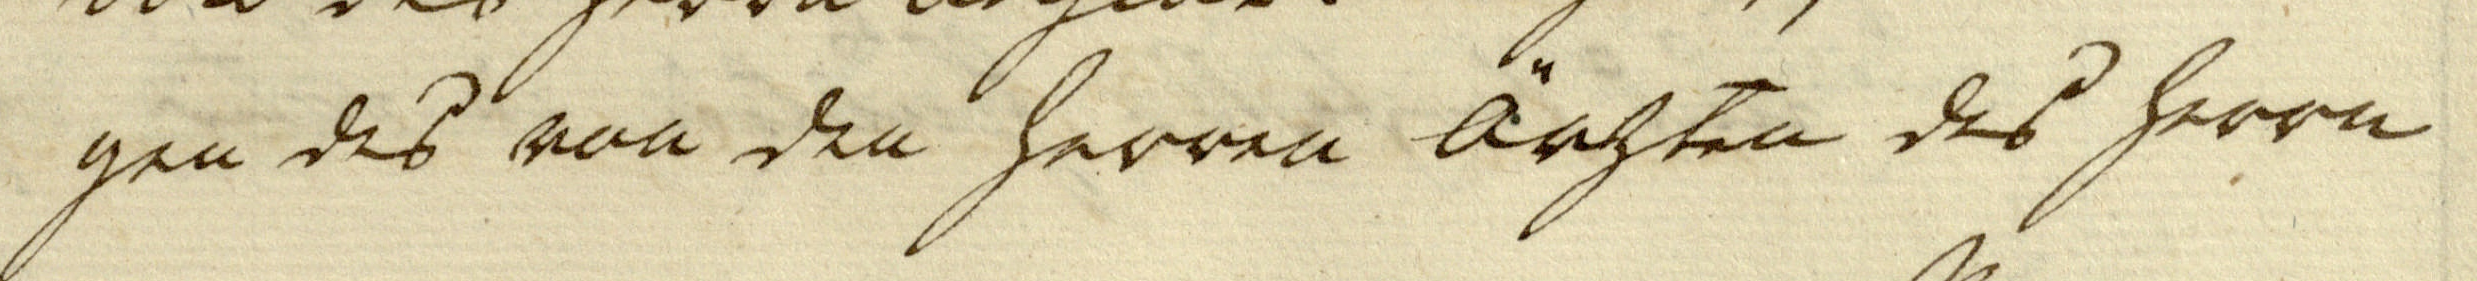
gen des von den Herren Ärzten des Herrn
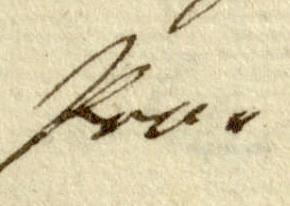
Pro¬
